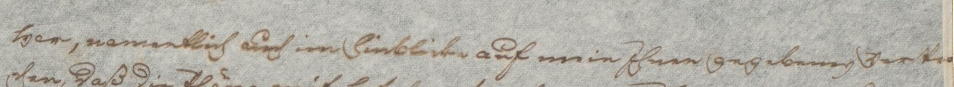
war, namentlich auch im Hinblicke auf mein Ihnen gegebenes Verspre-
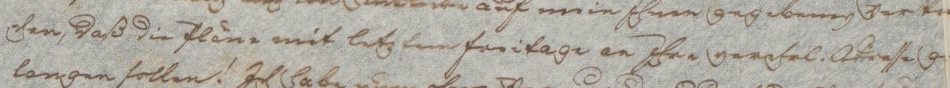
chen, daß die Pläne mit letztem Freitage an Ihre verehrl. Adresse ge-
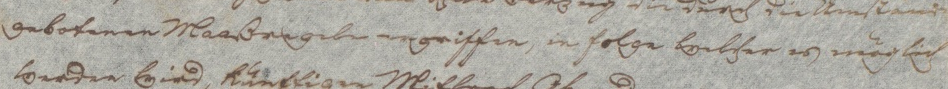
gebotenen Maaßregeln ergriffen, in Folge welcher es möglich
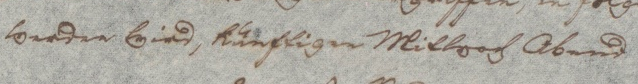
werden wird, künftigen Mittwoch Abend
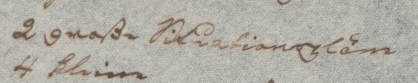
2 große Situationspläne
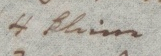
4 kleine "
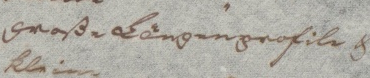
große Längenprofile &
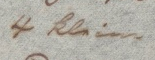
4 kleine "
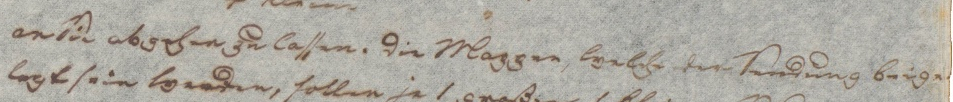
an Sie abgehen zu lassen. Die Mappen, welche der Sendung beige-
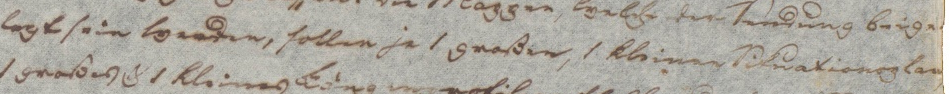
legt sein werden, sollen je 1 großen, 1 kleinen Situationsplan,
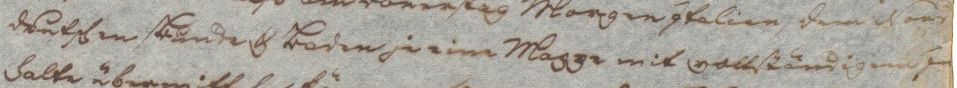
deutschen Bunde & Baden je eine Mappe mit vollständigem In-
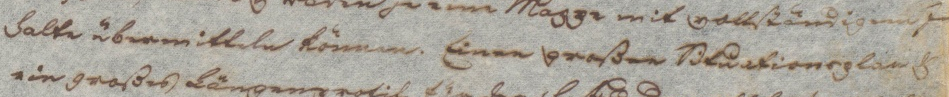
halte übermitteln können. Einen großen Situationsplan &
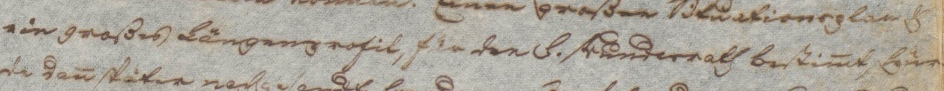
ein großes Längenprofil, für den H. Bundesrath bestimmt, wür-
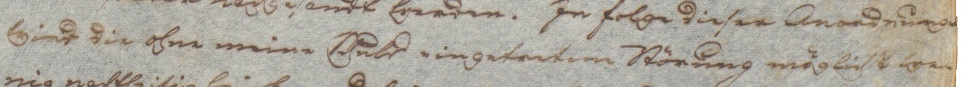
wird die ohne meine Schuld eingetretene Störung möglichst we-
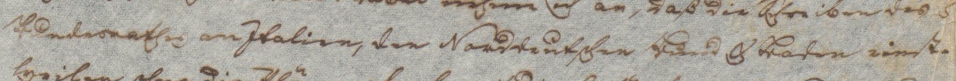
Bundesrathes an Italien, den Norddeutschen Bund & Baden einst-
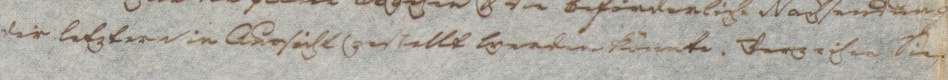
der letztern in Aussicht gestellt werden könnte. Verzeihen Sie,
